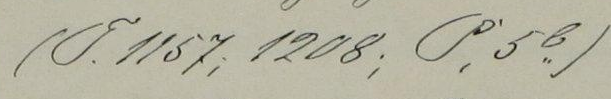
(T.1157; 1208; P.5b)
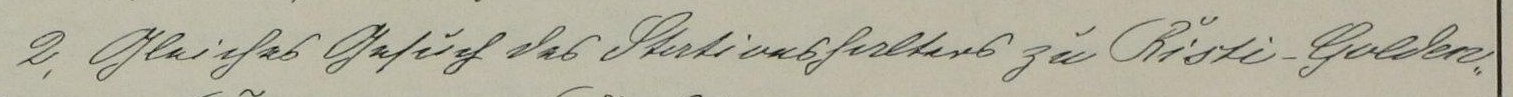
2. Gleiches Gesuch des Stationshalters zu Risti-Golden-
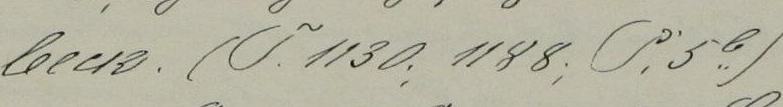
beck. (T.1130; 1188; P.5b)
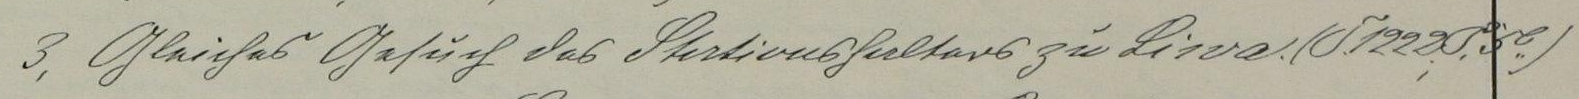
3. Gleiches Gesuch des Stationshalters zu Liwa. (T.1222; P.5b)
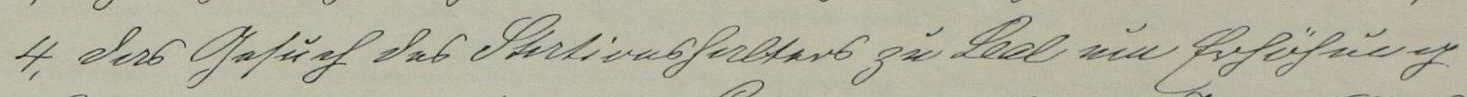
4. Das Gesuch des Stationshalters zu Leal um Erhöhung
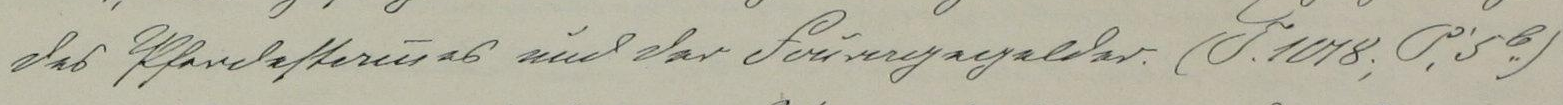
des Pferdestammes und der Fouragegelder. (T.1018; P.5b)
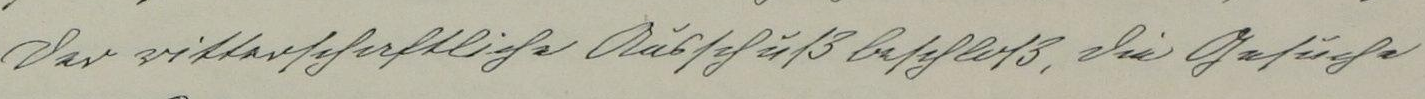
Der ritterschaftliche Ausschuß beschloß, die Gesuche
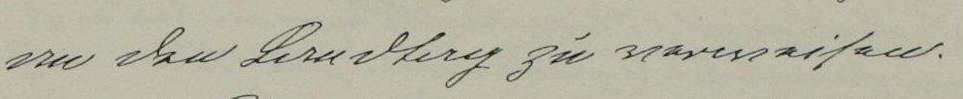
an den Landtag zu verweisen.
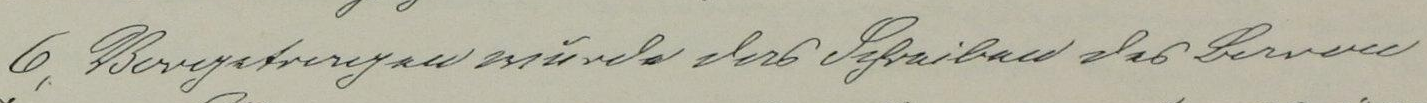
6. Vorgetragen wurde das Schreiben des Baron
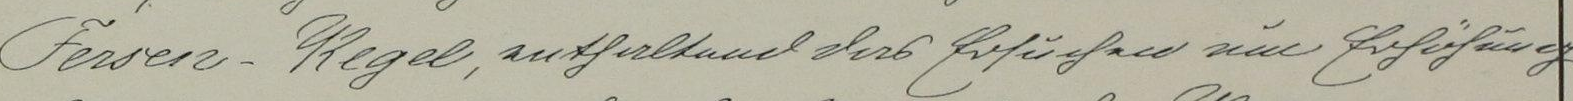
Fersen-Kegel, enthaltend das Ersuchen um Erhöhung
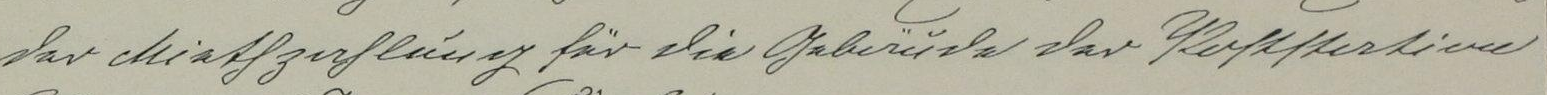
der Miethzahlung für die Gebäude der Poststation
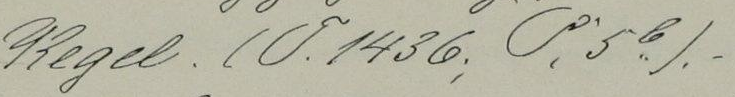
Kegel. (T.1436; P.5b).
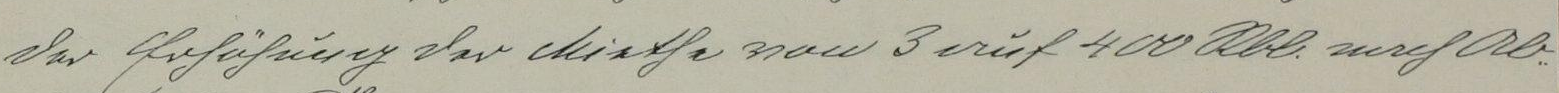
der Erhöhung der Miethe von 3 auf 400 Rbl. nach Ab-
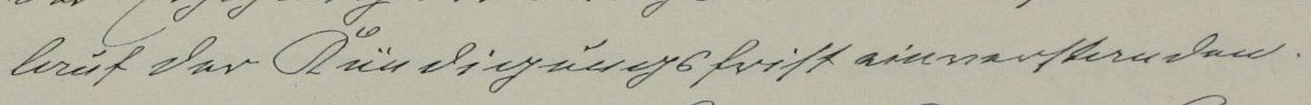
lauf der Kündigungsfrist einverstanden.
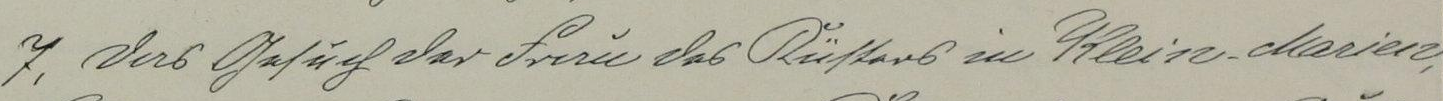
7. Das Gesuch der Frau des Küsters in Klein-Marien,
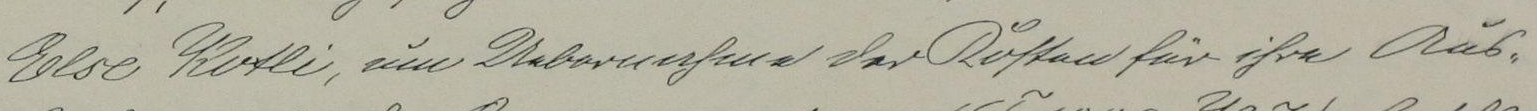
Else Kotli, um Uebernahme der Kosten für ihre Aus-
